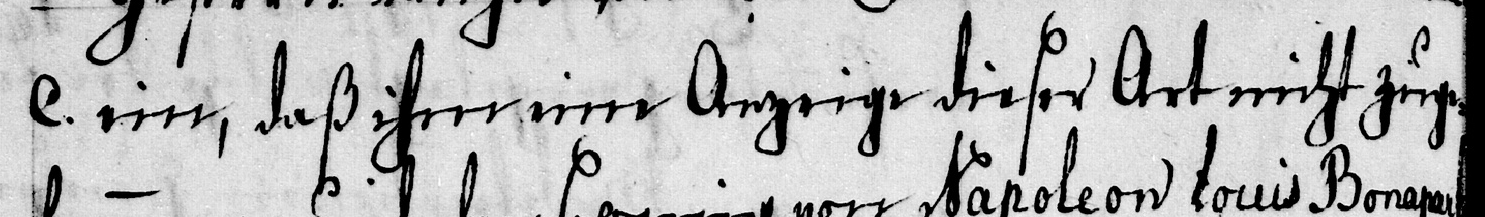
C. ein, daß ihm eine Anzeige dieser Art nicht zuge¬
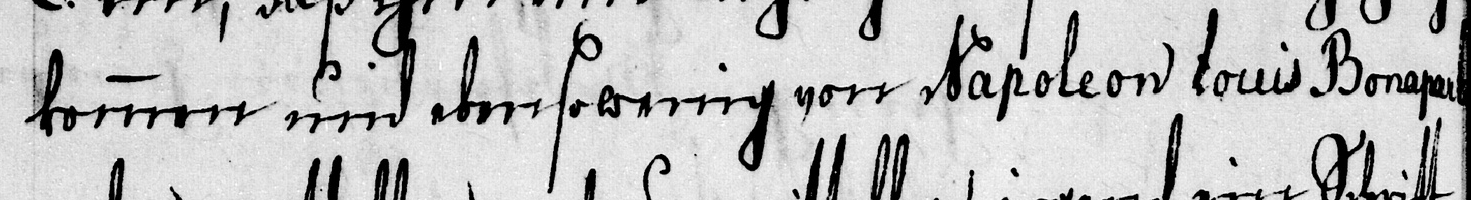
kommen und ebensowenig von Napoleon Louis Bonaparte
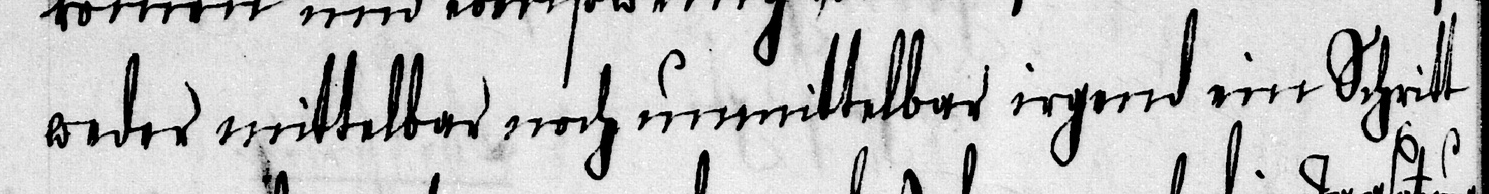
weder mittelbar noch unmittelbar irgend ein Schrit¬
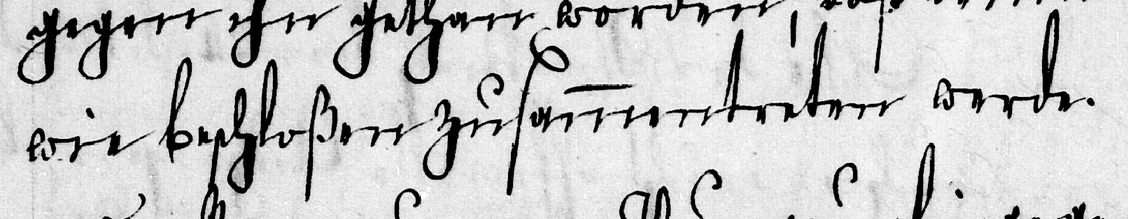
wie beschloßen zusammentreten werde.
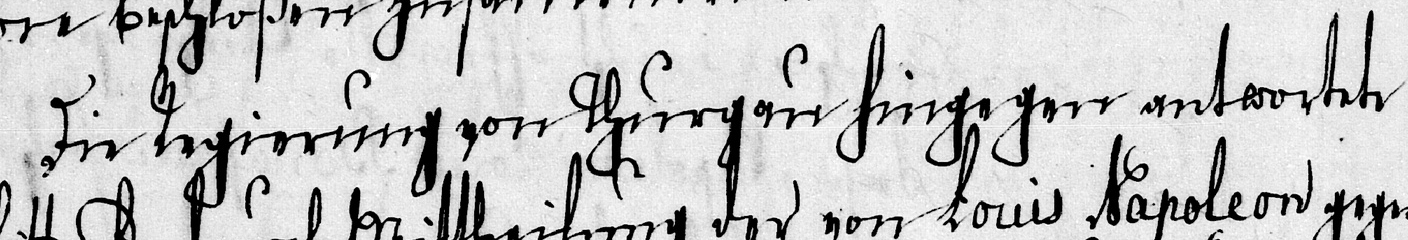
Die Regierung von Thurgau hingegen antwortete
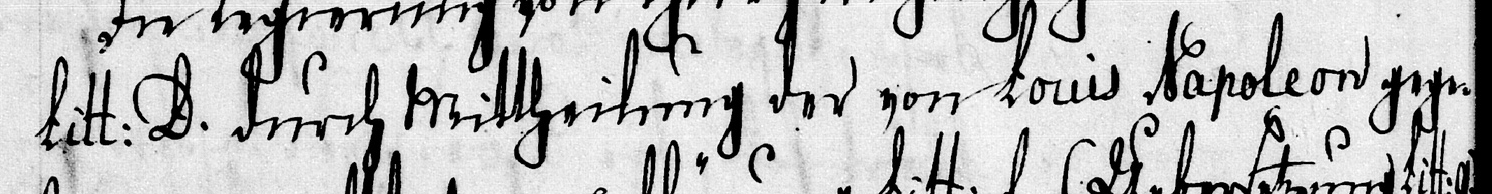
Litt: D. durch Mittheilung der von Louis Napoleon gege¬
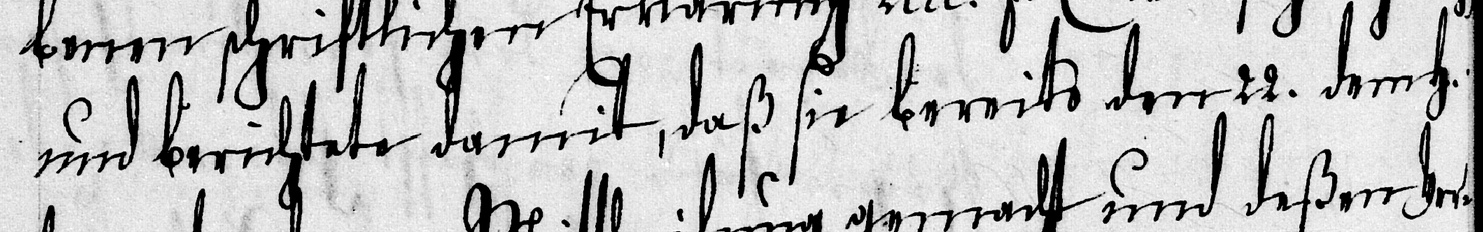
und berichtete damit, daß sie bereits den 22. dem H.
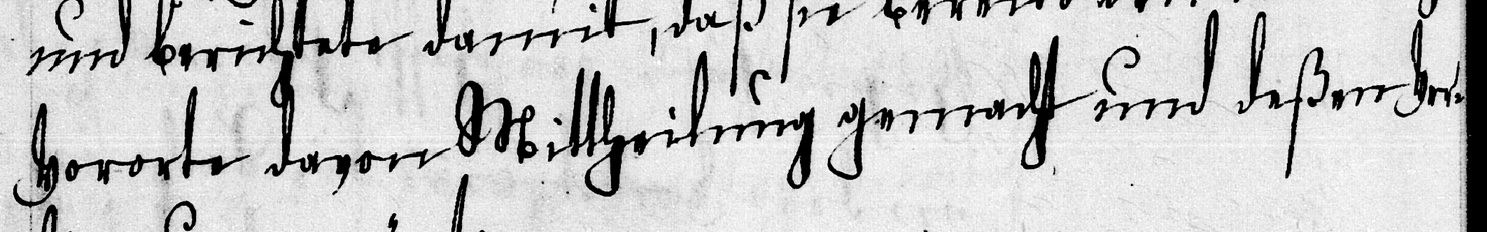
Vororte davon Mittheilung gemacht und deßen Ver¬
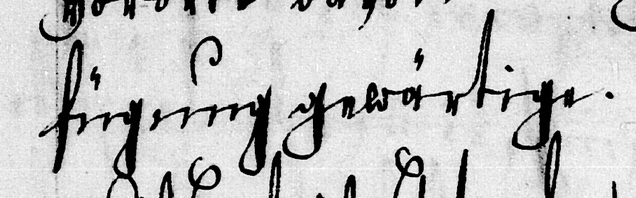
fügung gewärtige.
